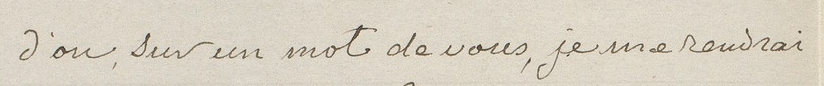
d'ou, sur un mot de vous, je me rendrai
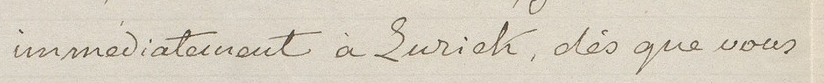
immédiatement à Zurich, dès que vous
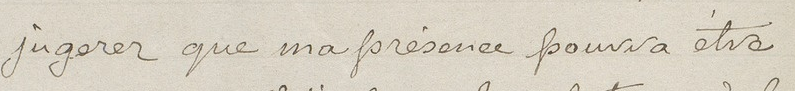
jugerez que ma présence pourra être
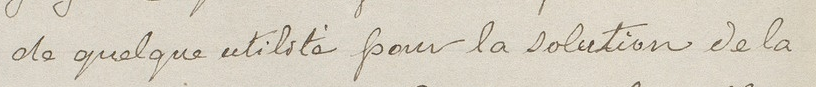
de quelque utilité pour la solution de la
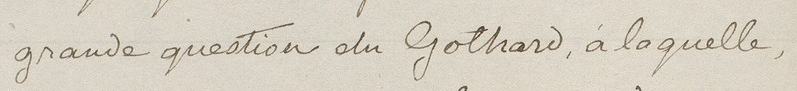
grande question du Gothard, à laquelle,
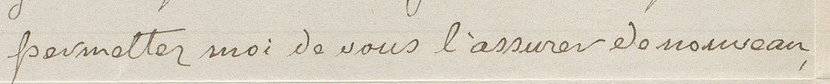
permettez moi de vous l'assurer de nouveau,
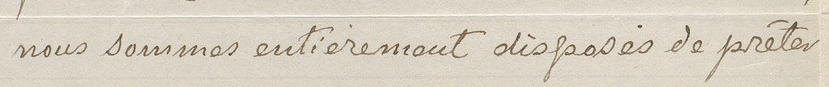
nous sommes entièrement disposés de prêter
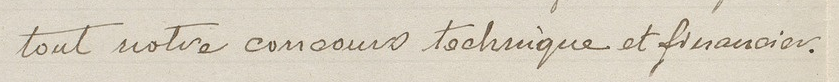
tout notre concours technique et financier.
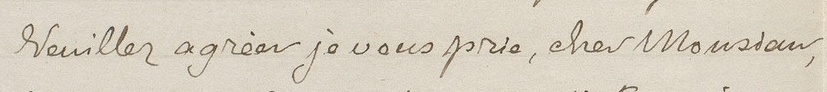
Veuillez agréer je vous prie, cher Monsieur,
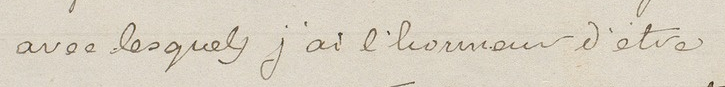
avec lesquels j'ai l'honneur d'être
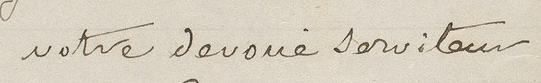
votre devoué serviteur
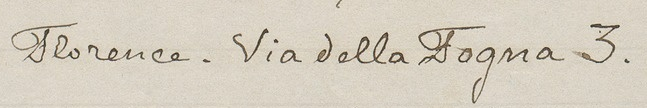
Florence, Via della Fogna 3.
